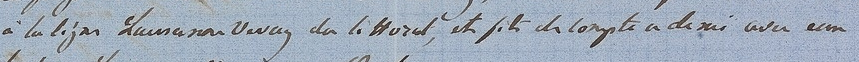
à la ligne LausanneVevey du littoral, et fit de compte a demi avec une
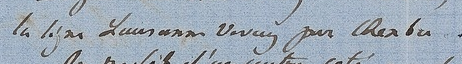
la ligne LausanneVevey par Chexbres.
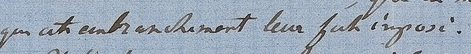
que cet embranchement leur fut imposé.
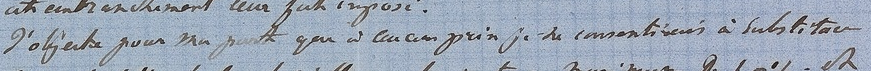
J'objecte pour ma part que à aucun prix je-ne consentirais à substituer
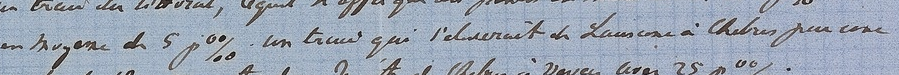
en moyen de 5 p%. Un tracé qui s'éleverait de Lausanne à Chebres par une
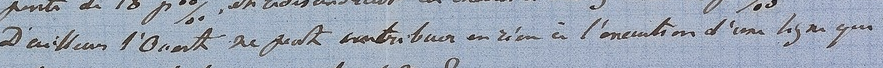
D'ailleurs l'Ouest ne peut contribuer en rien à l'execution d'une ligne qui
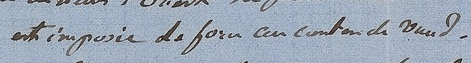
est imposée de force au canton de Vaud.
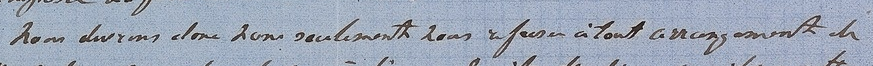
Nous devrons donc non seulement nous refuser à tout arrangement de
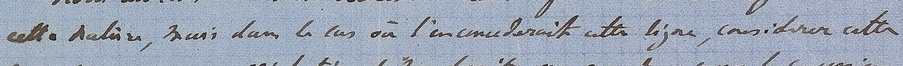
cette nature, mais dans le cas où l'on concederait cette ligne, considerer cette
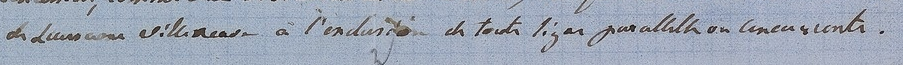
de LausanneVilleneuve à l'exclusion de toute ligne parallele ou concurrente.
